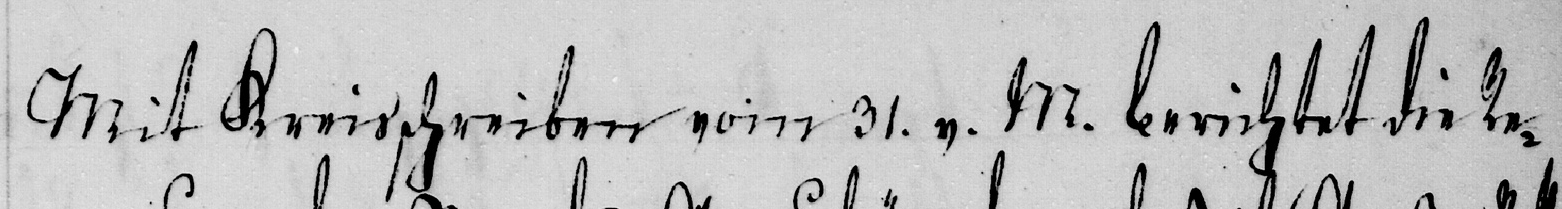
Mit Kreisschreiben vom 31. v. M. berichtet die Re¬
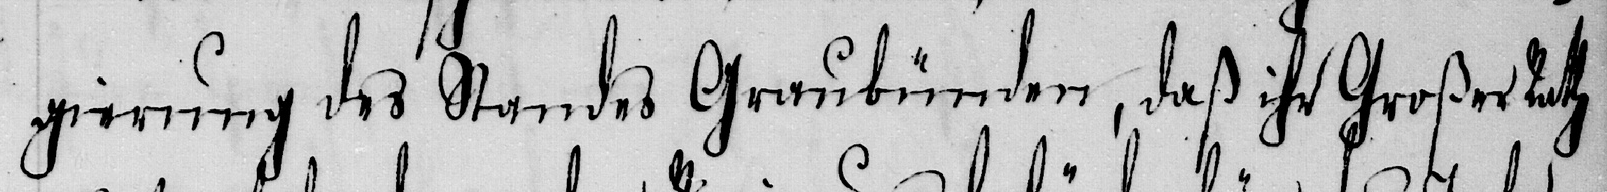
gierung des Standes Graubünden, daß ihr Großer Rath
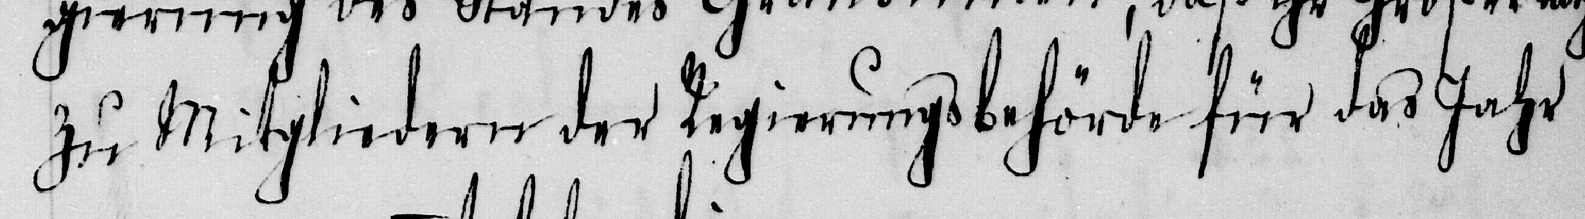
zu Mitgliedern der Regierungsbehörde für das Jahr
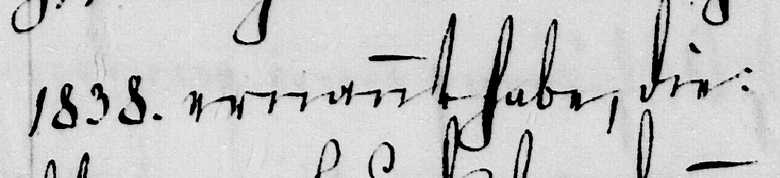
1838. ernannt habe, die:
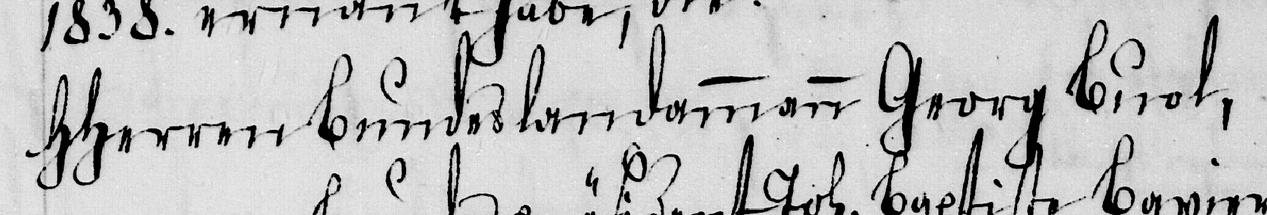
Hherren Bundeslandammann Georg Buol,
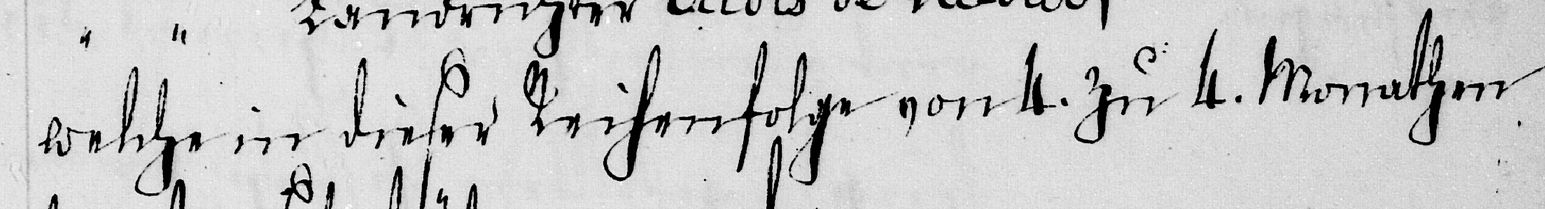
welche in dieser Reihenfolge von 4. zu 4. Monathen
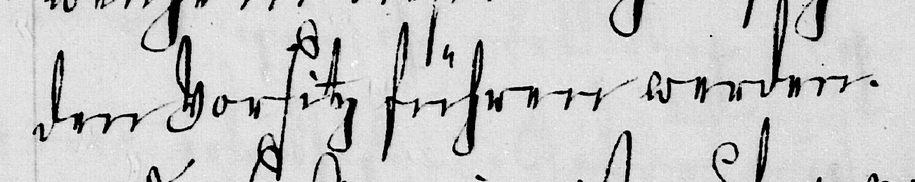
den Vorsitz führen werden.
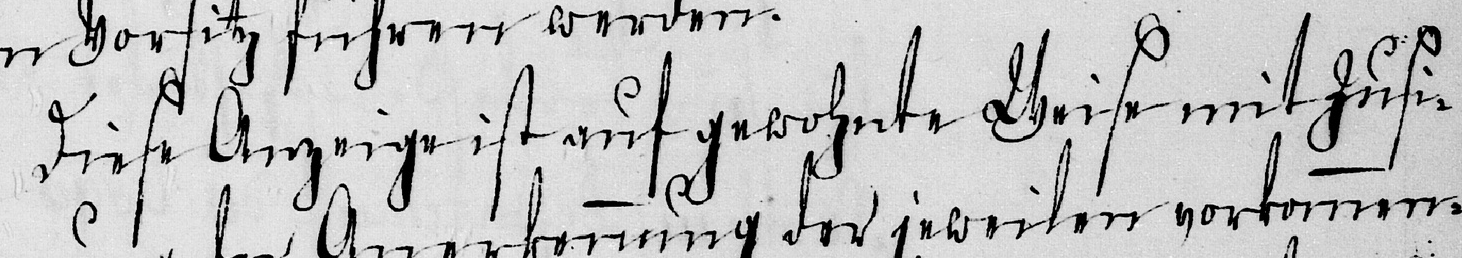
Diese Anzeige ist auf gewohnte Weise mit Zusi¬
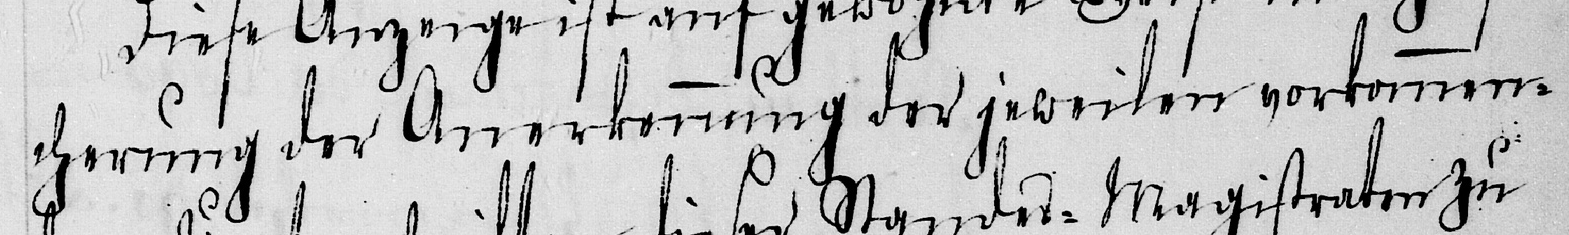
cherung der Anerkennung der jeweilen vorkommen¬
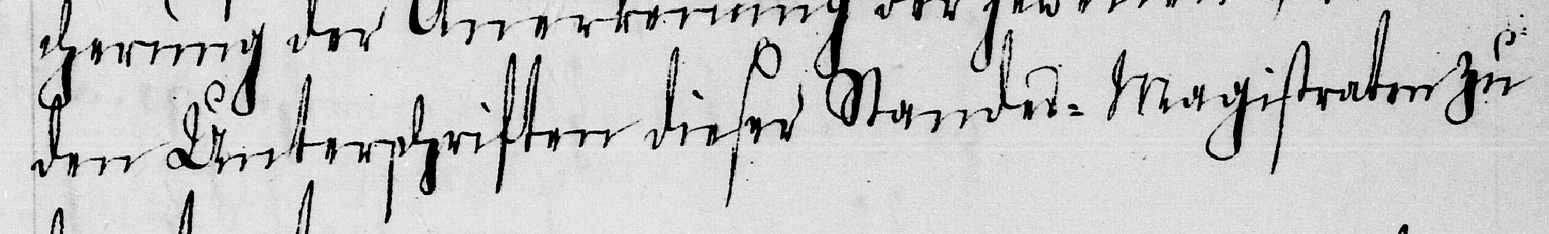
den Unterschriften dieser Standes-Magistraten zu
